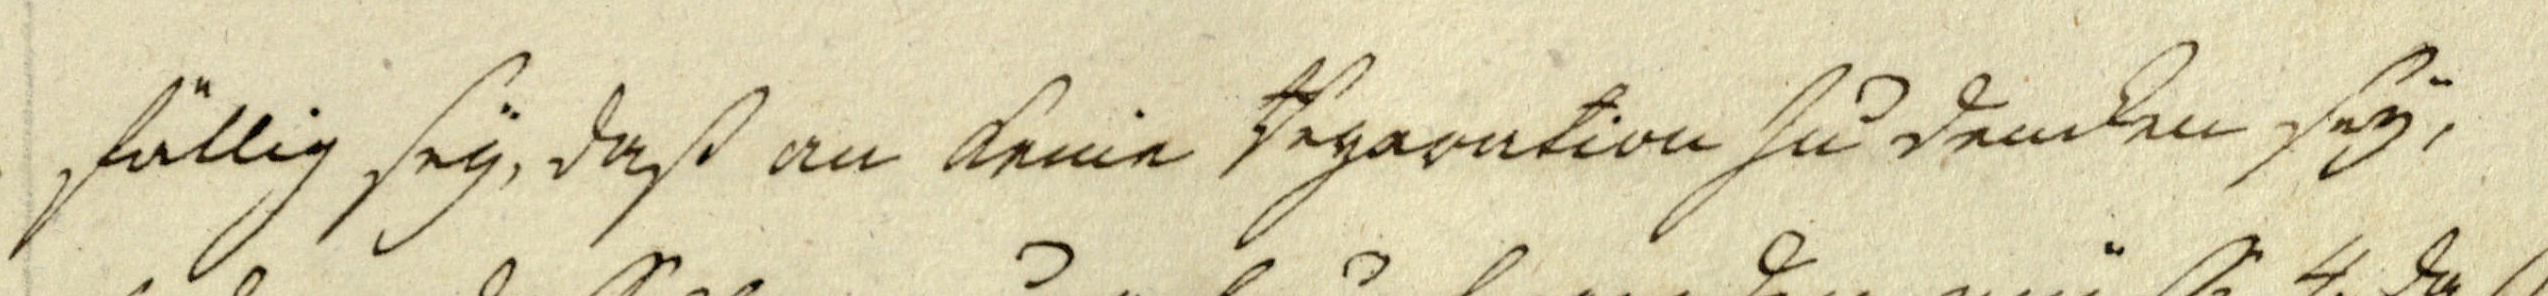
fällig seÿ, daß an keine Reparation zu dencken seÿ,
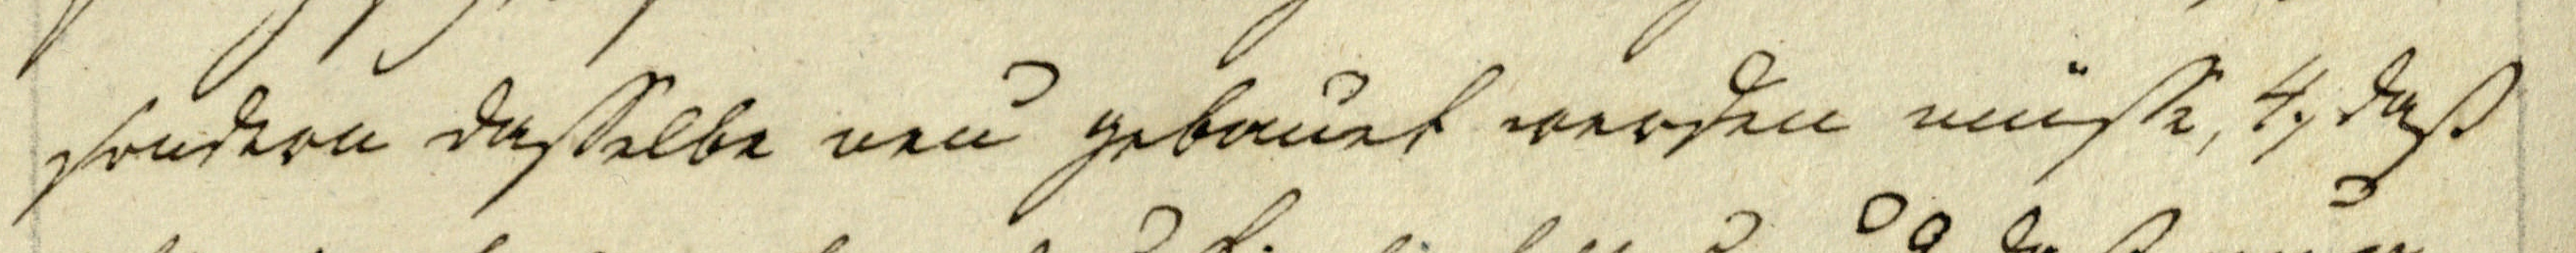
sondern dasselbe neu gebauet werden müsse, 4., daß
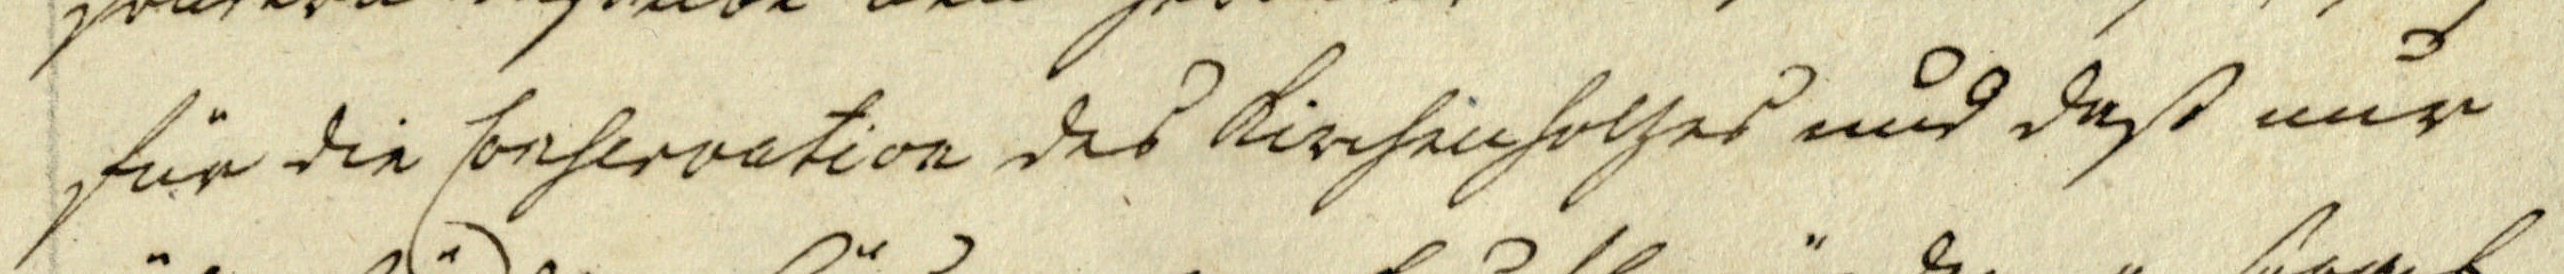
für die Conservation des Kirchenholzes und daß nur
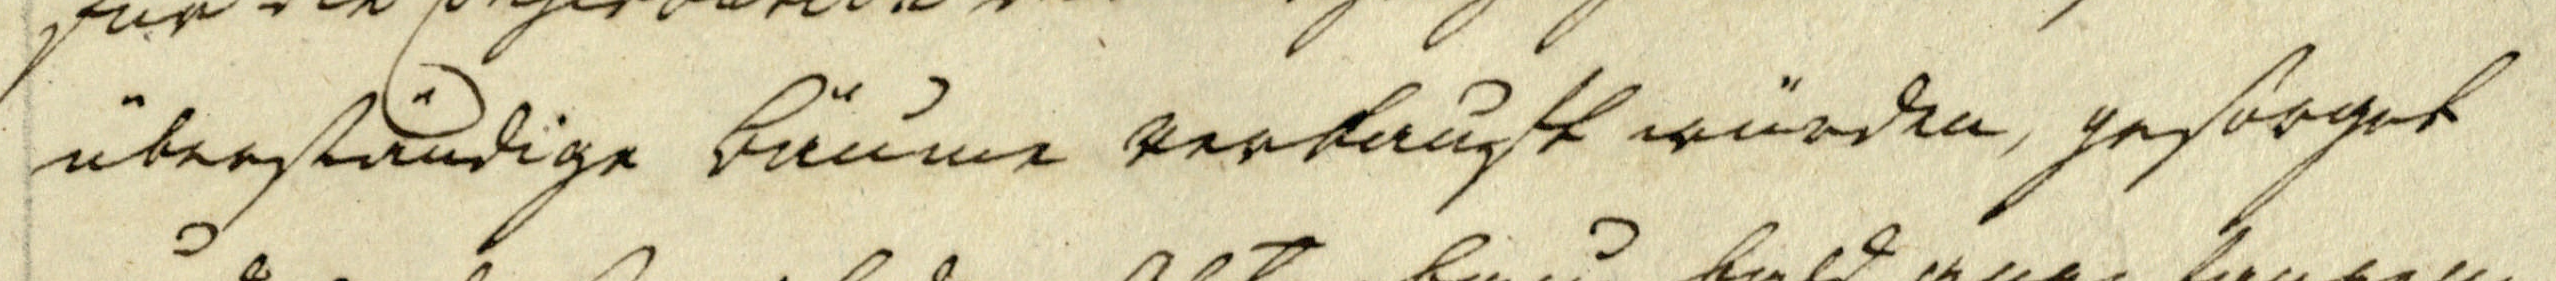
überständige Bäume verkauft würden, gesorget
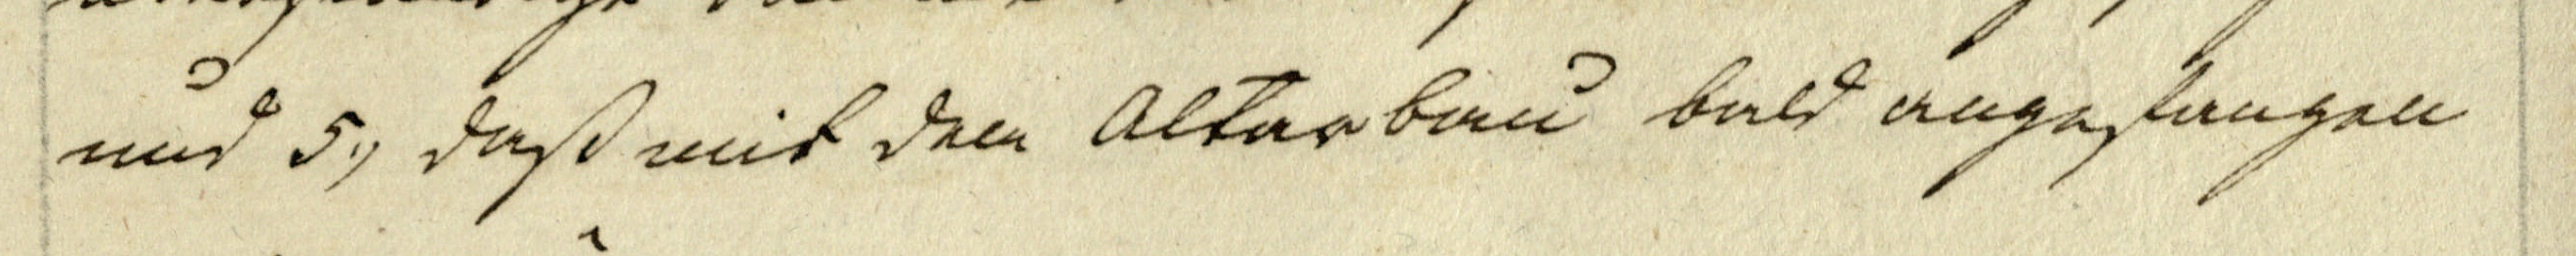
und 5., daß mit den Altarbau bald angefangen
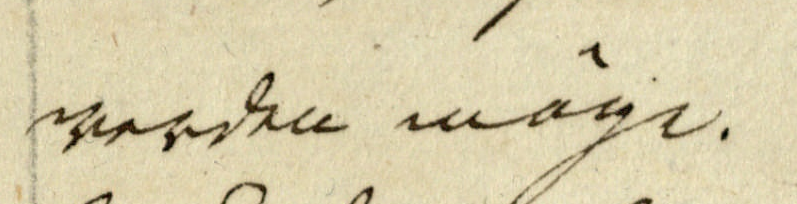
werden möge.
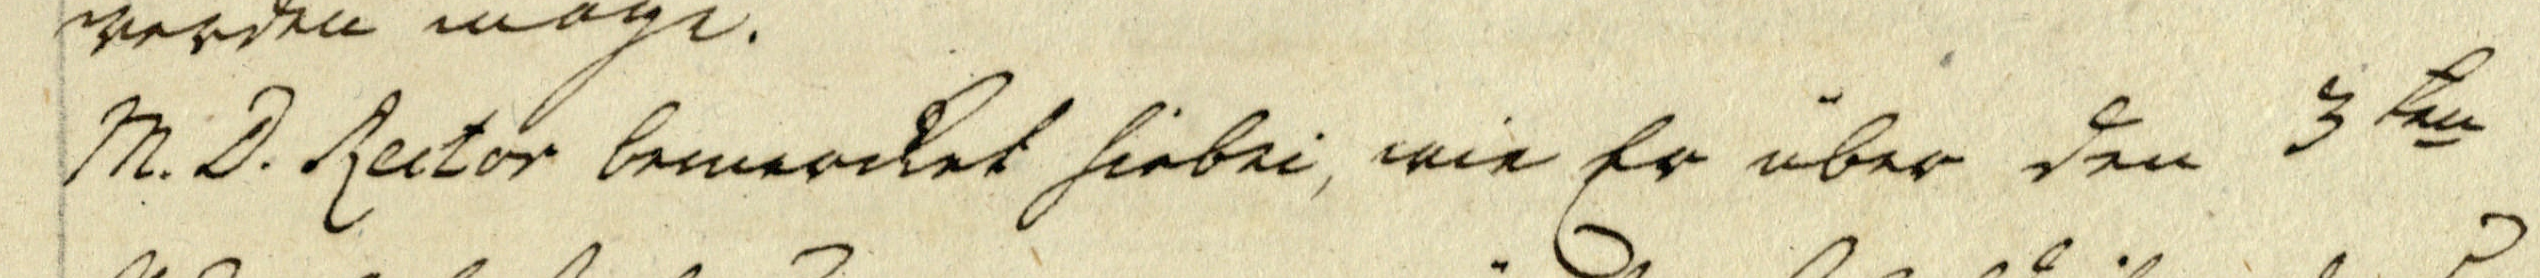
M. D. Rector bemercket hiebei, wie Er über den 3 ten
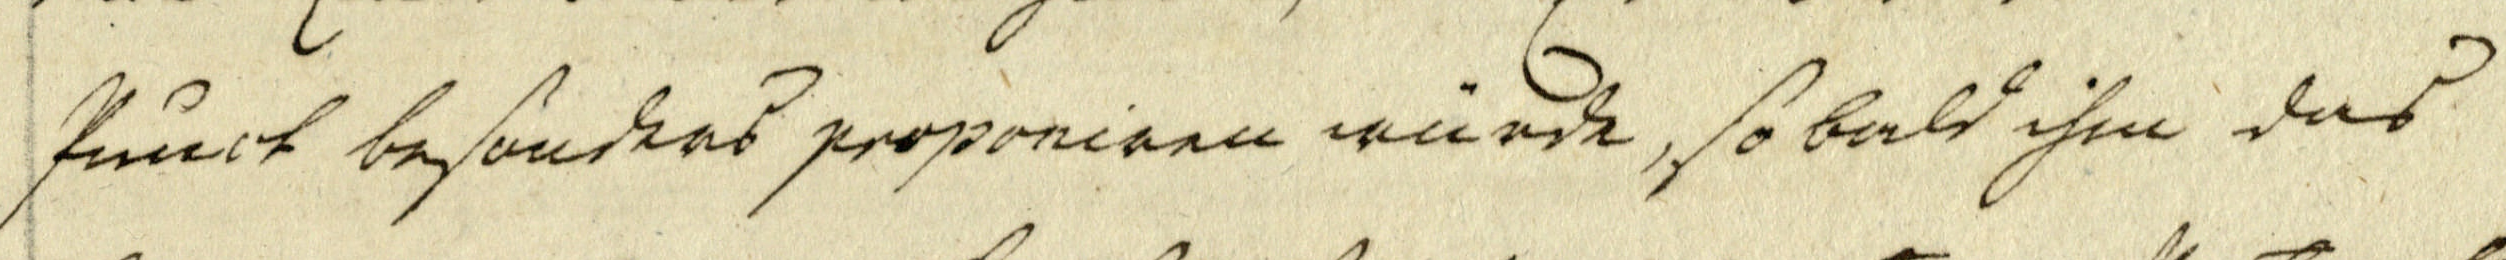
Punct besonders proponiren würde, so bald ihm das
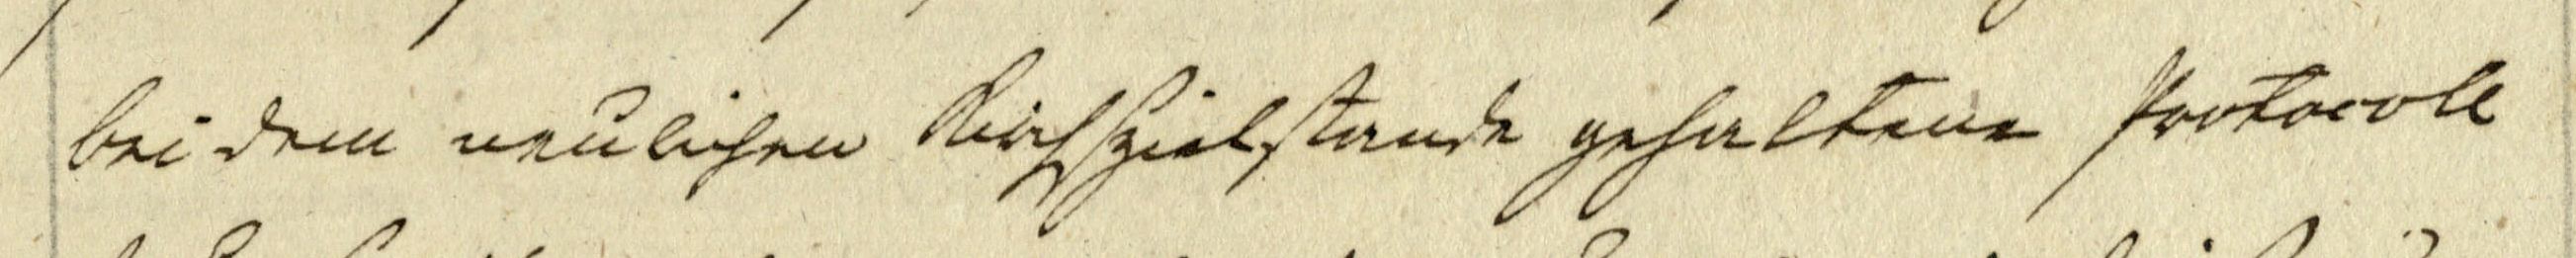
bei dem neulichen Kirchpielstande gehaltene Protocoll
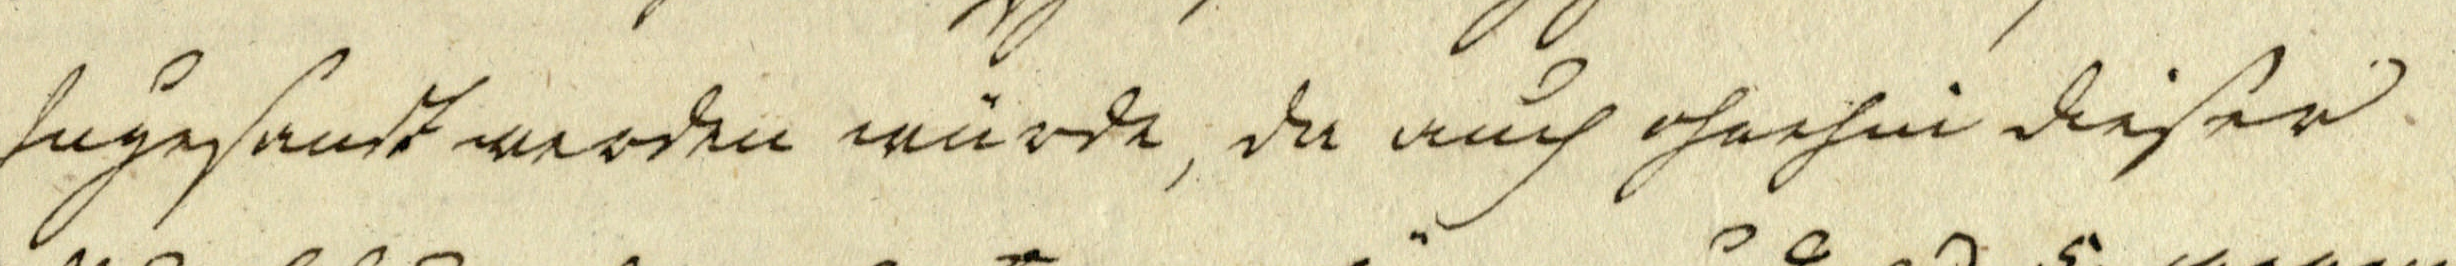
zugesandt werden würde, da auch ohnehin dieser
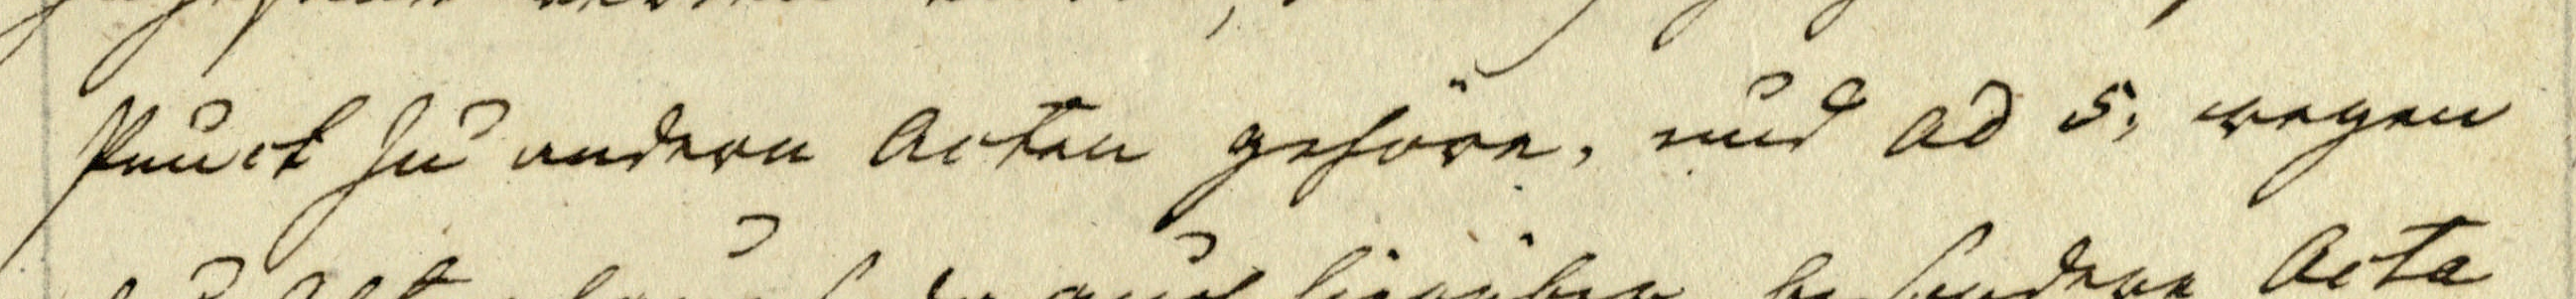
Punct zu andern Acten gehöre; und ad 5., wegen
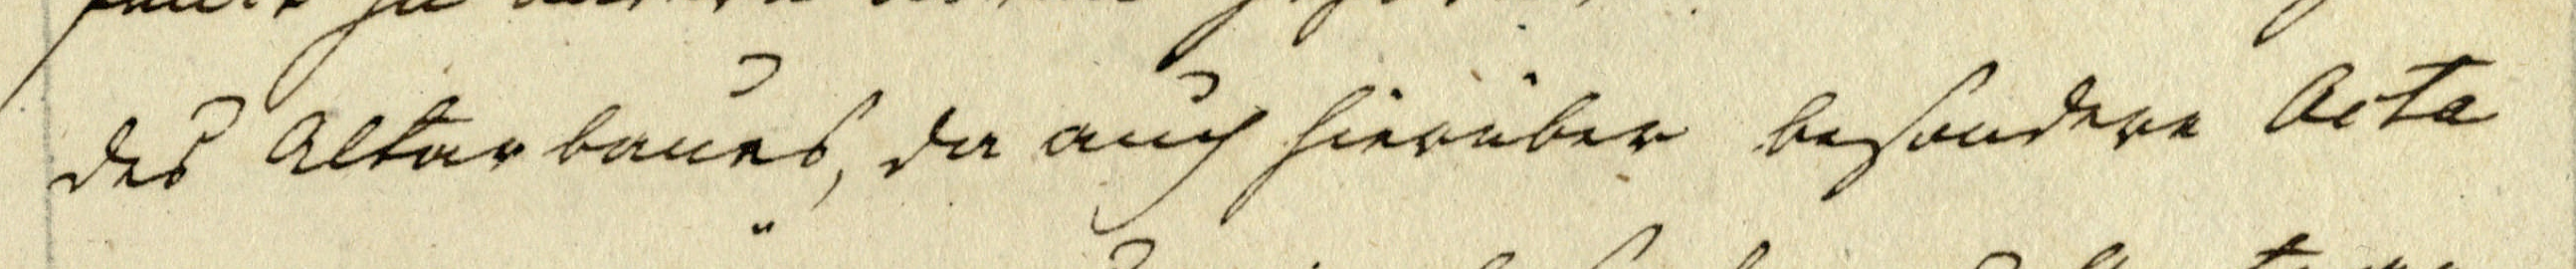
des Altarbaues, da auch hierüber besondere Acta
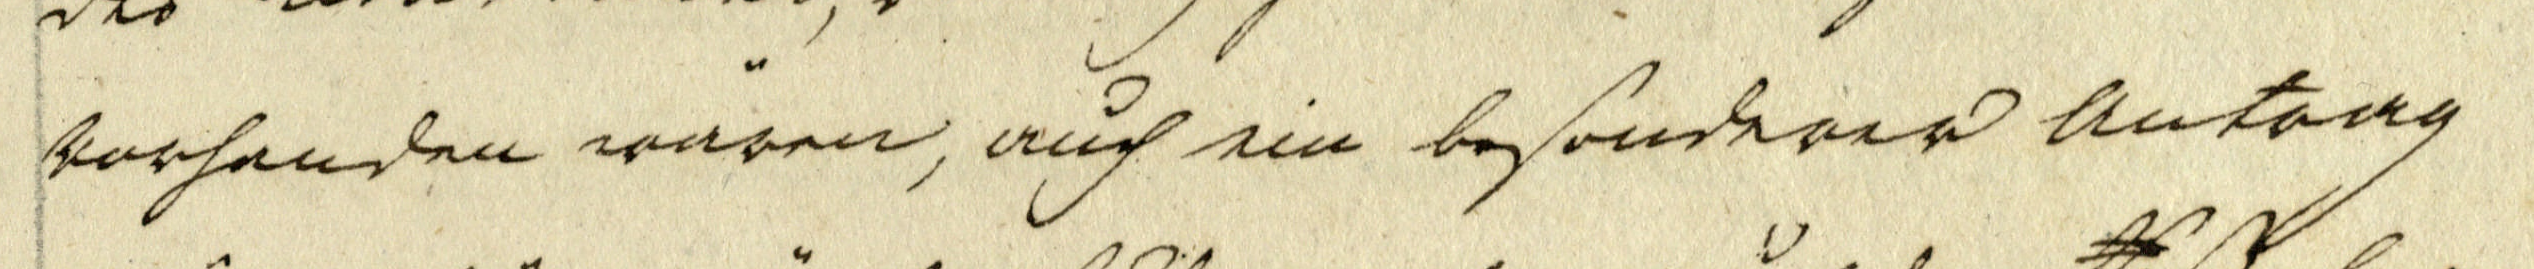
vorhanden wären, auch ein besonderer Antrag
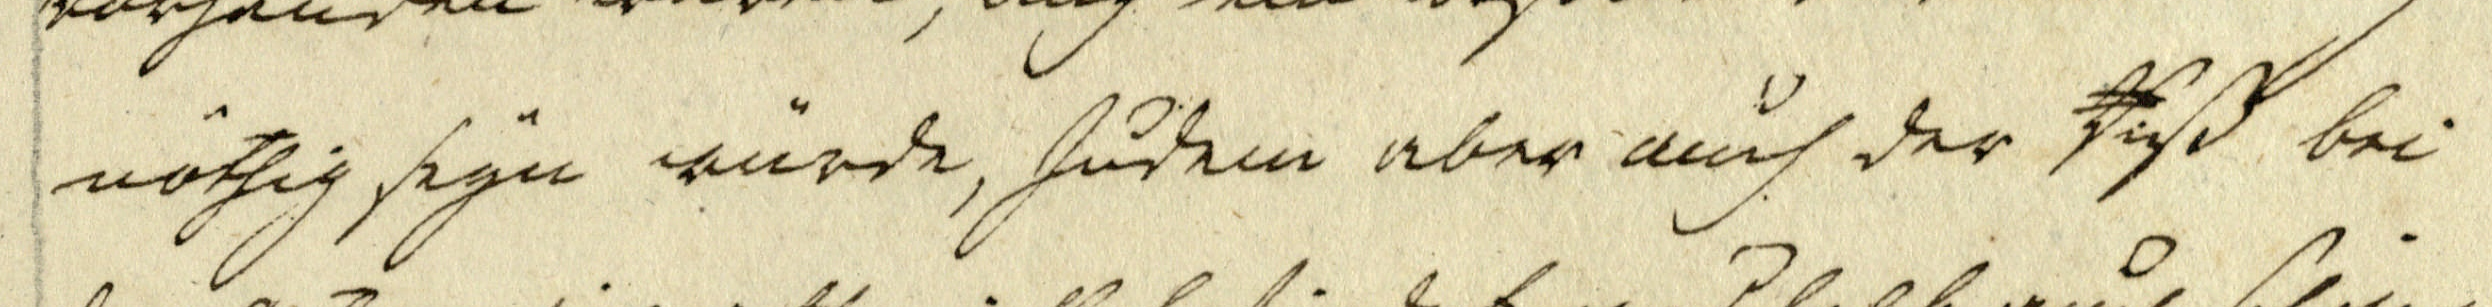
nöthig seÿn würde, zudem aber auch der Riß bei
